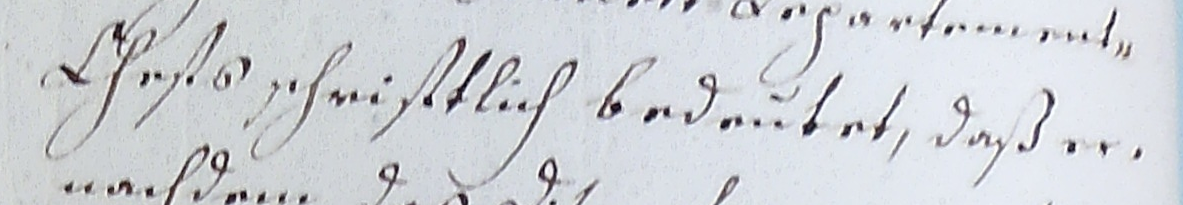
Chefs schriftlich bedeutet, daß er,
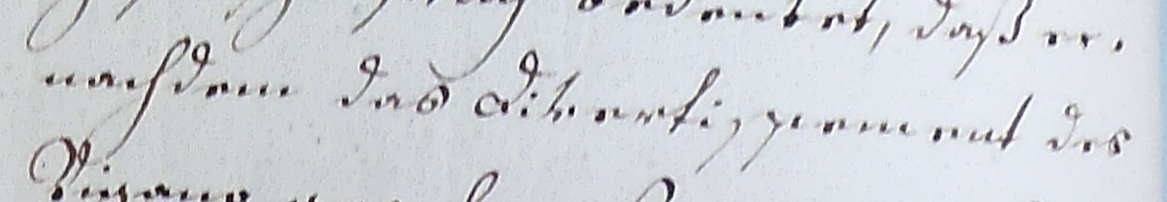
nachdem das Divertissement des
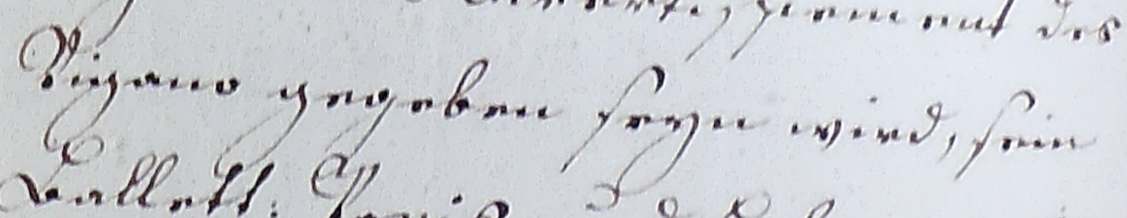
Vigano gegeben seyn wird, sein
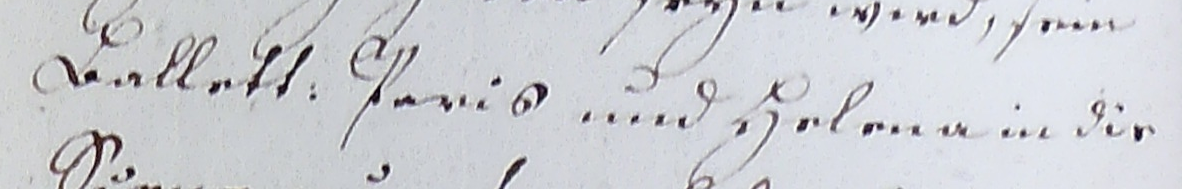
Ballett: Paris und Helena in die
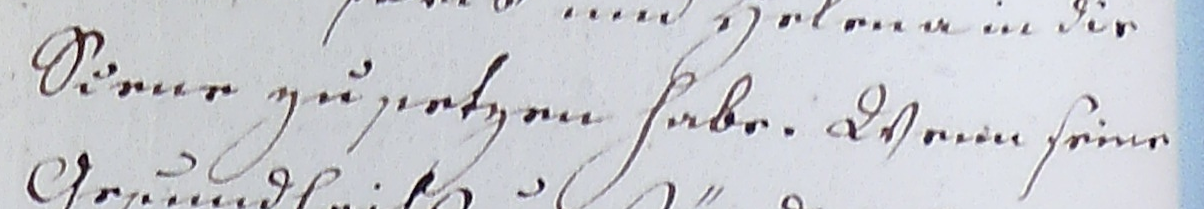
Scene zusetzen habe. Wenn seine
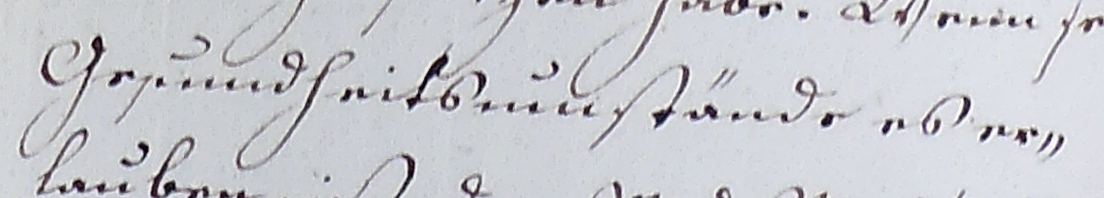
Gesundheitsumstände es er¬
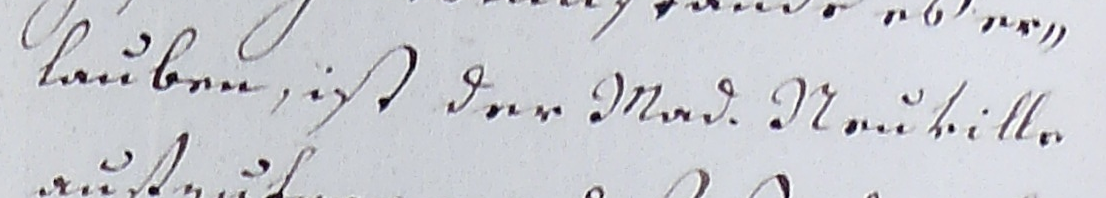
lauben, ist der Mad. Neuville
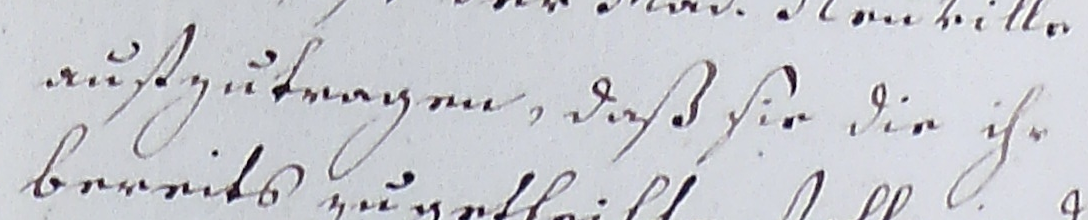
aufzutragen, daß sie die ihr
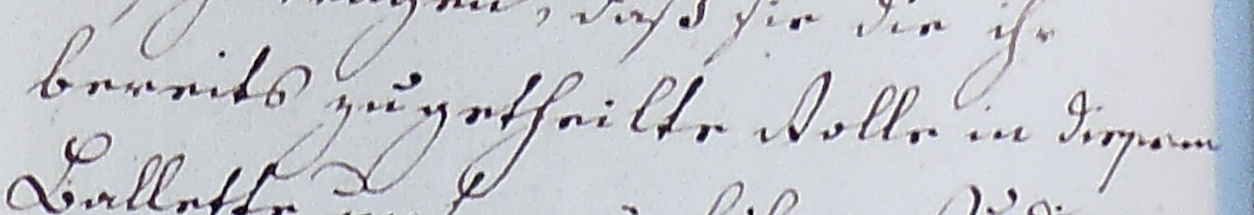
bereits zugetheilte Rolle in diesem
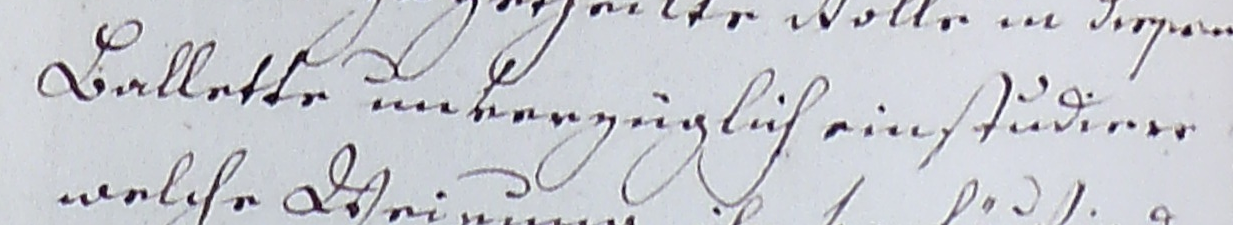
Ballette unverzüglich einstudiere
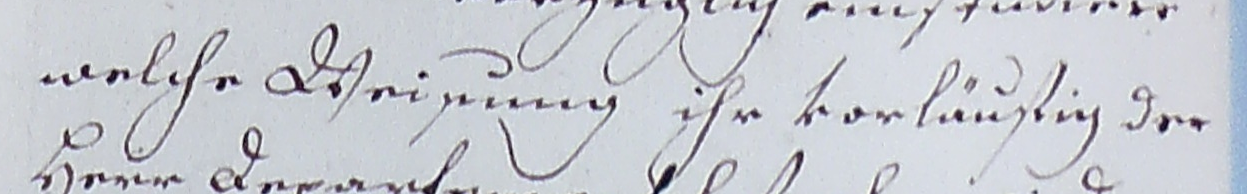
welche Weisung ihr vorläufig der
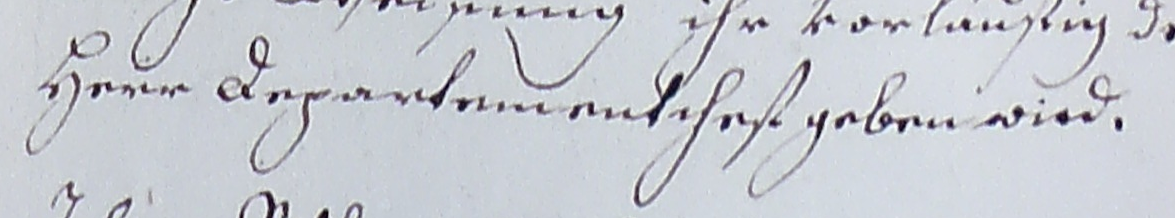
Herr Departementchef geben wird.
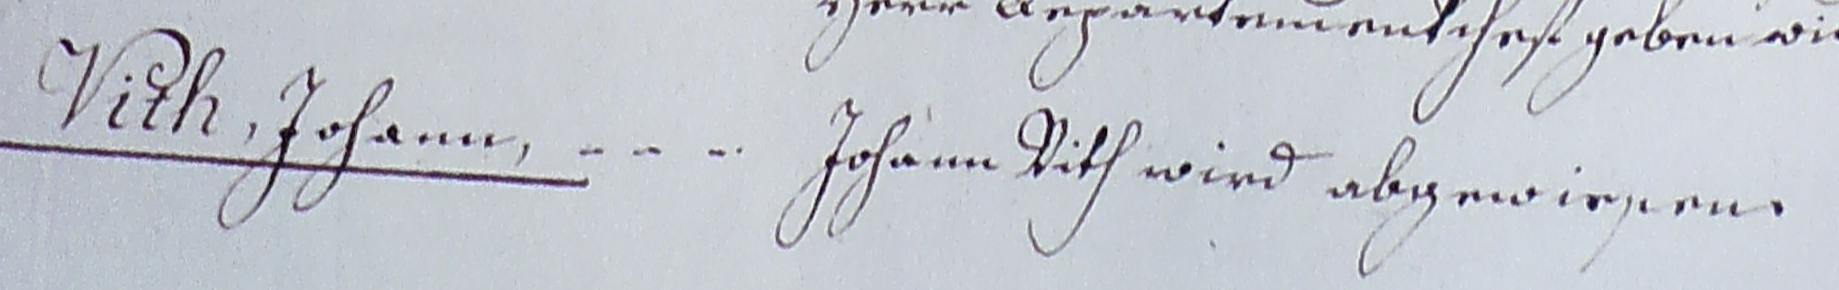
Vith, Johann, .. .. .. Johann Vith wird abgewiesen.
